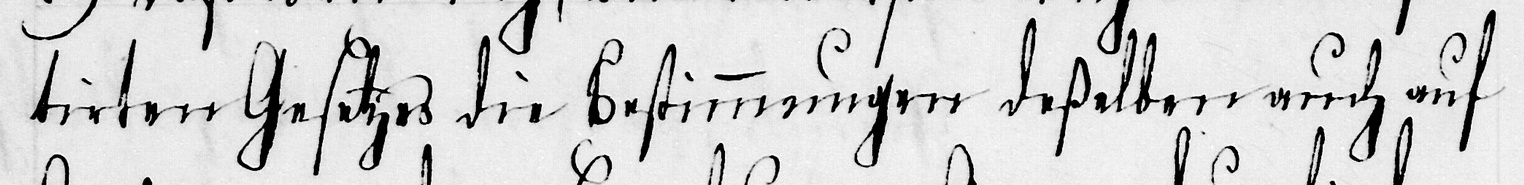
tirten Gesetzes die Bestimmungen deßelben auch auf
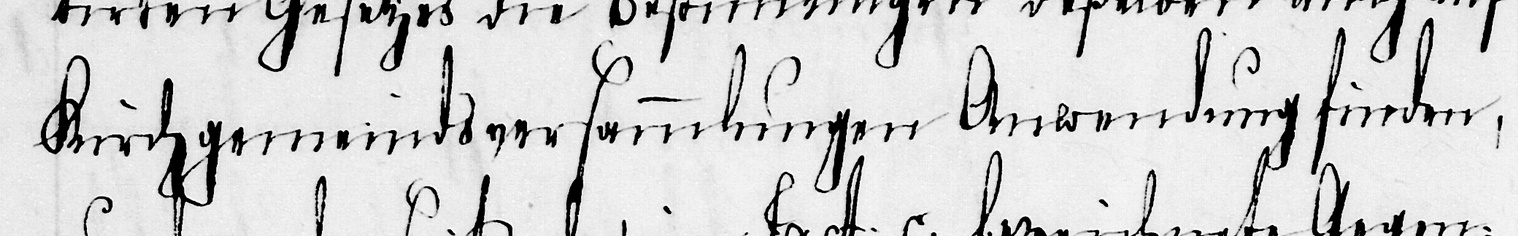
Kirchgemeindsversammlungen Anwendung finden,
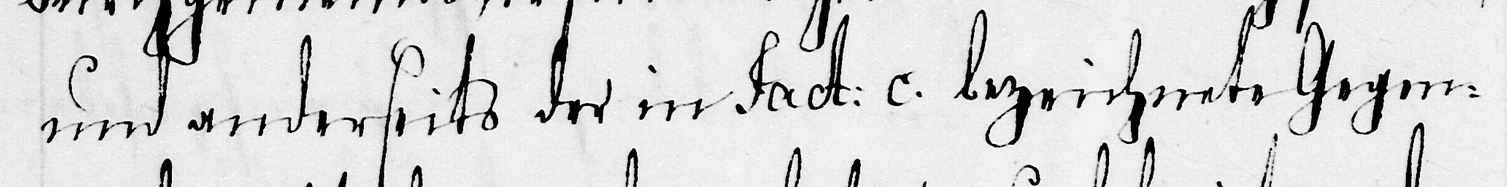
und anderseits der in Fact: c. bezeichnete Gegen¬
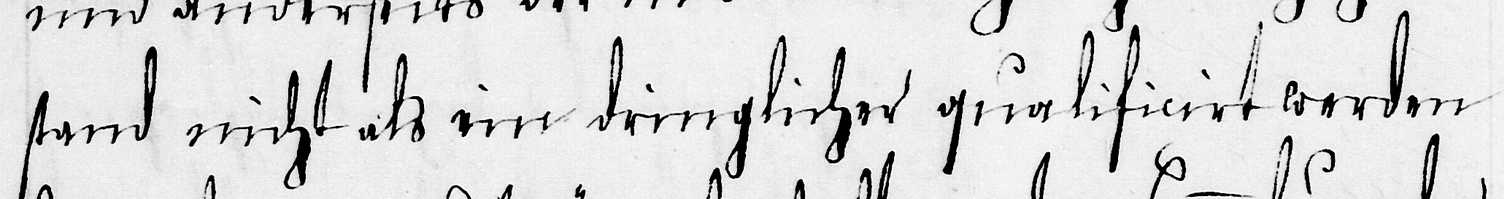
stand nicht als ein dringlicher qualificirt werden
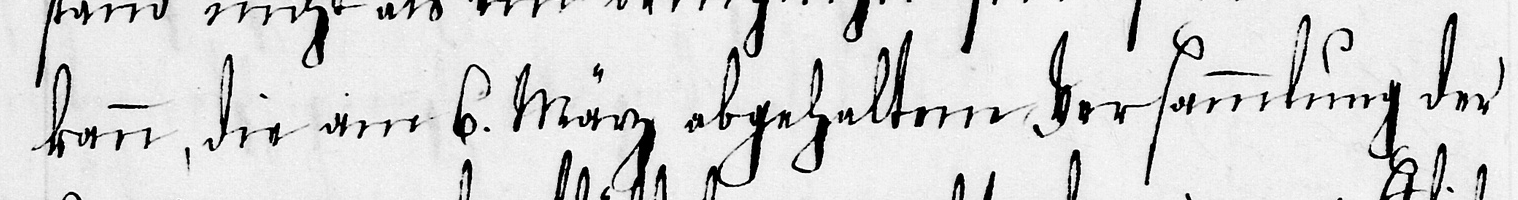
kann, die am 6. März abgehaltene Versammlung der
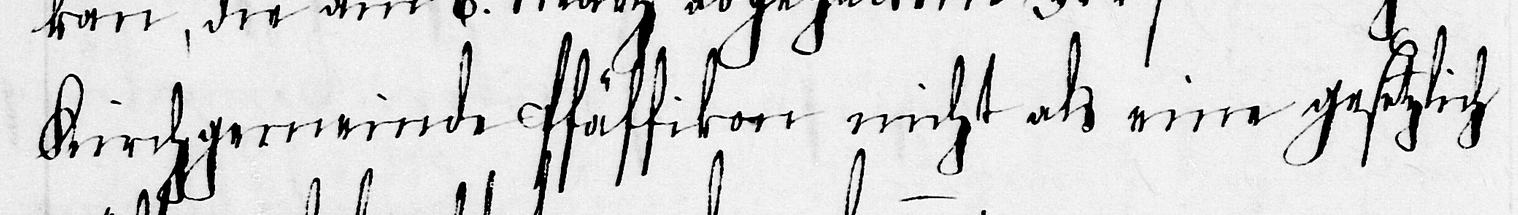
Kirchgemeinde Pfäffikon nicht als eine gesetzlich
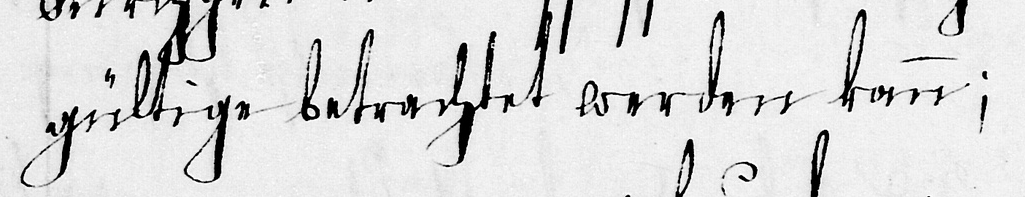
gültige betrachtet werden kann;
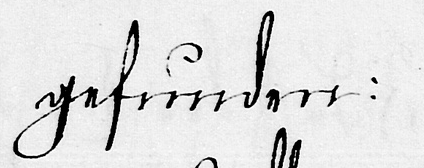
gefunden:
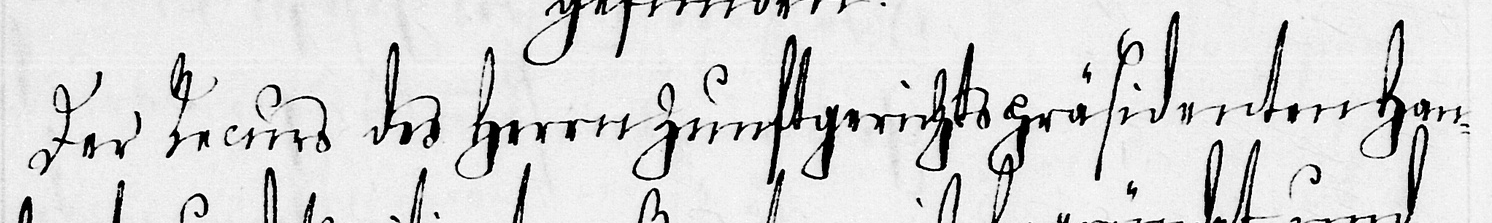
Der Recurs des Herrn Zunftgerichtspräsidenten Hanh¬
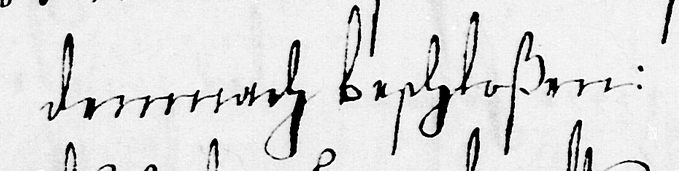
demnach beschloßen:
